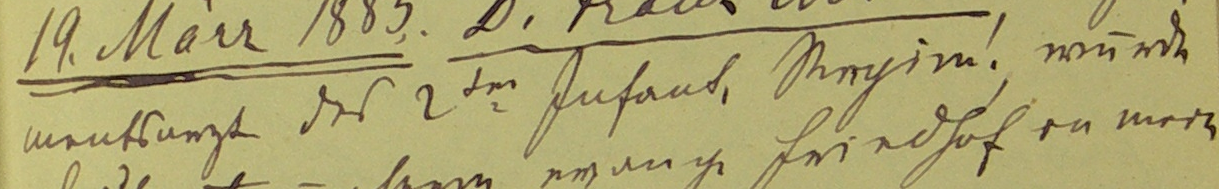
mentsarzt des 2-ten Infanterieregiments wurde
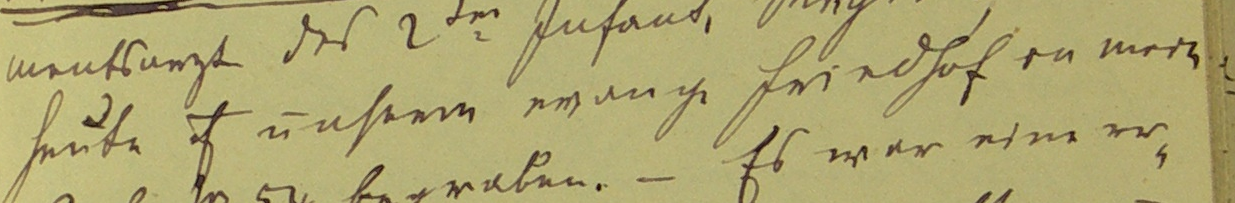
heute in unserem evang.. Friedhof
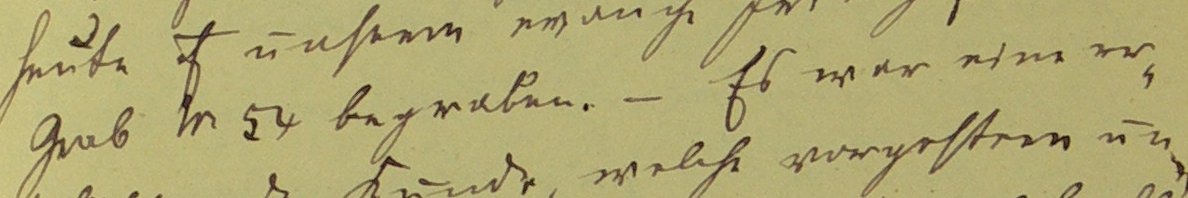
begraben.- Es war eine er¬
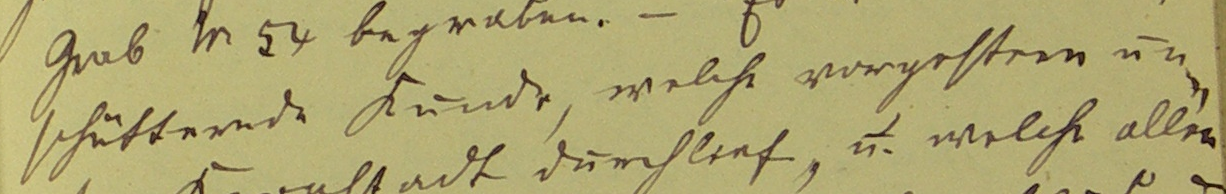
schütternde Kunde, welche vorgestern un¬
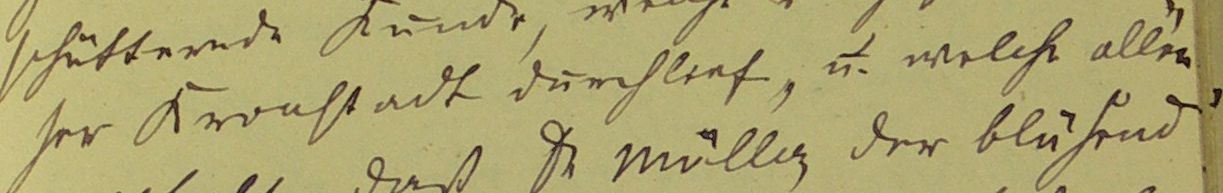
ser Kronstadt durchlief, und welche allen
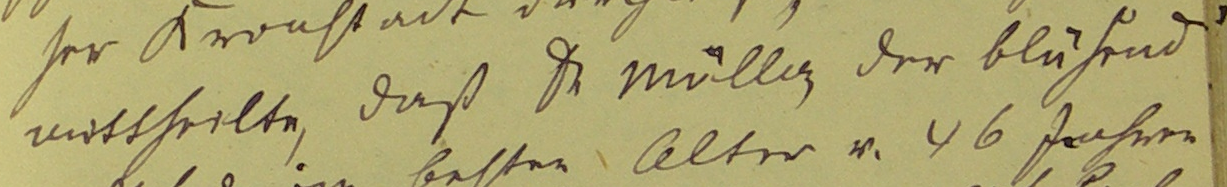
mittheilte daß Dr. Müller der blühend
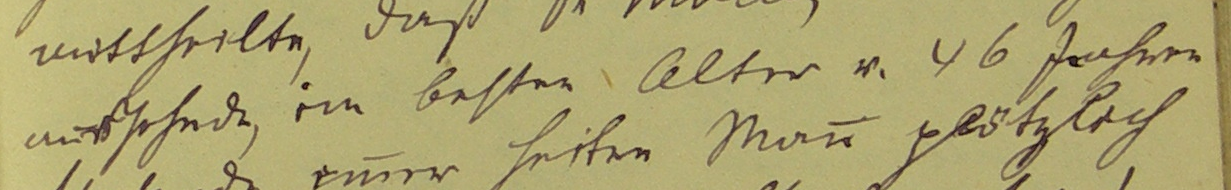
aussehende in bestem Alter von 46 Jahren
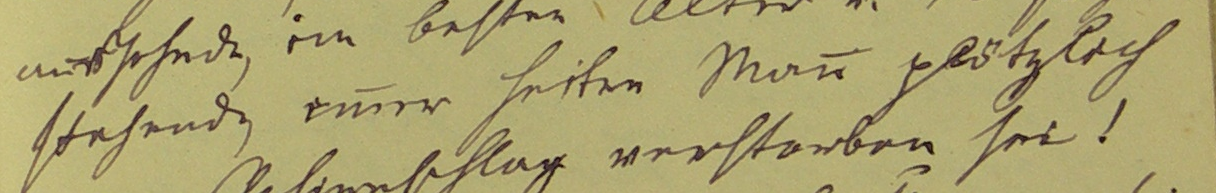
stehende, immer heitere Mann plötzlich
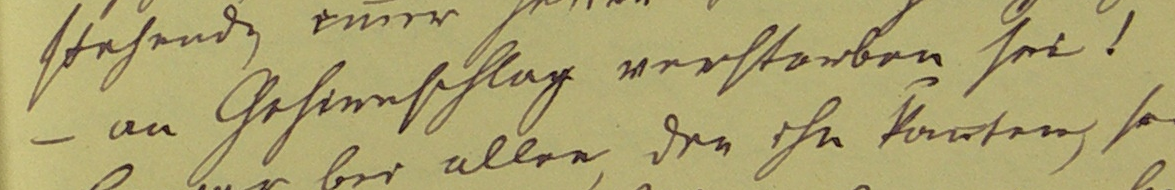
– an Gehirnschlag verstorben sei.!
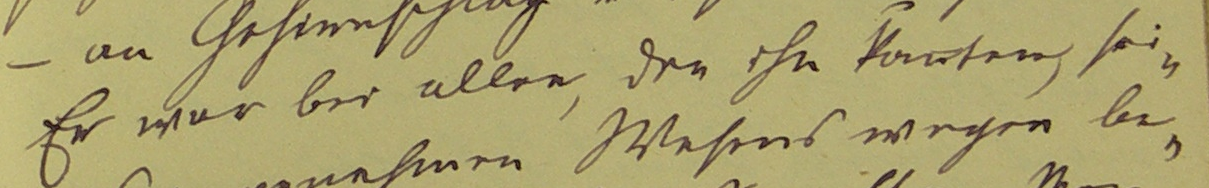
Er war bei allen, die ihn kannten sei¬
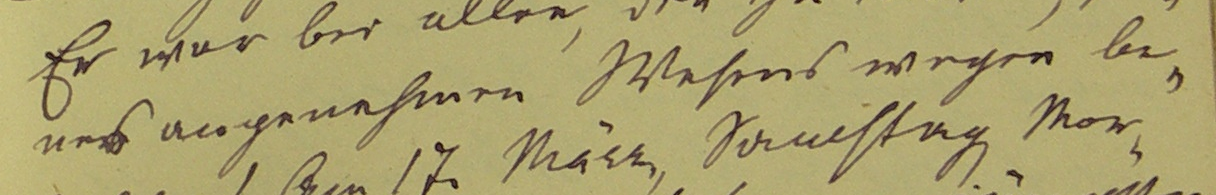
nes angenehmen Wesens wegen be¬
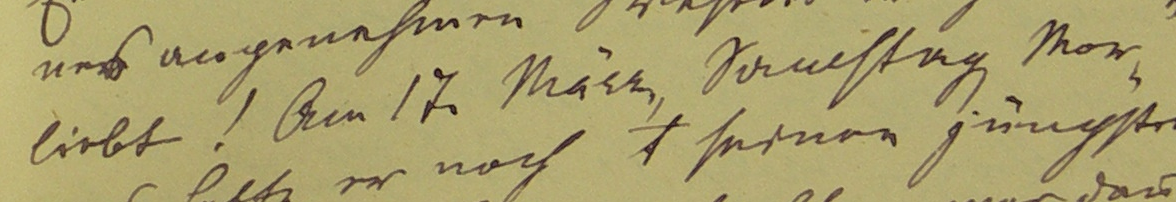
liebt.! Am 17. März Sonntags Mor¬
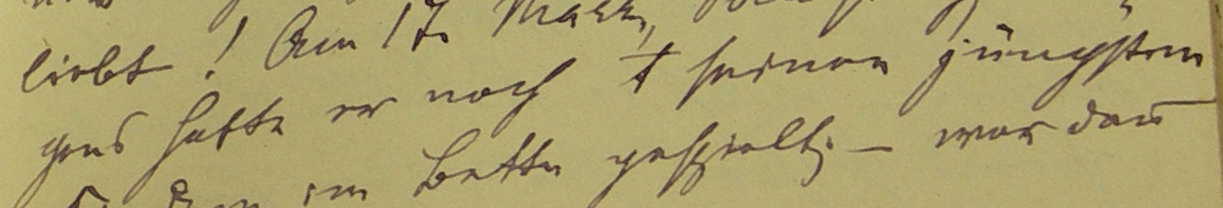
gen hatte er noch mit seinen jüngsten
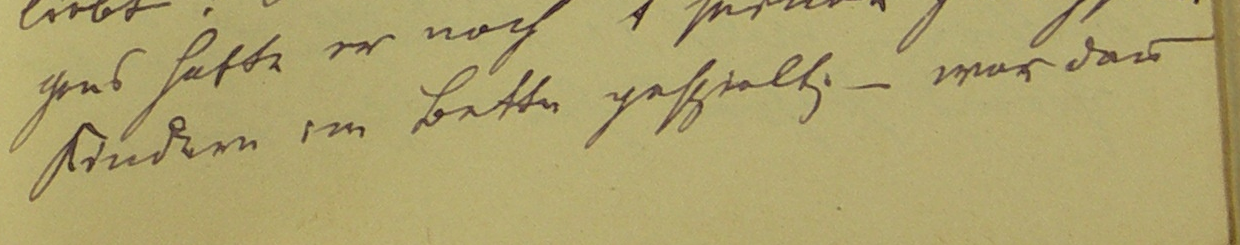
Kindern im Bette gespielt.- war dann
